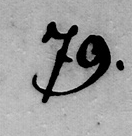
2.)
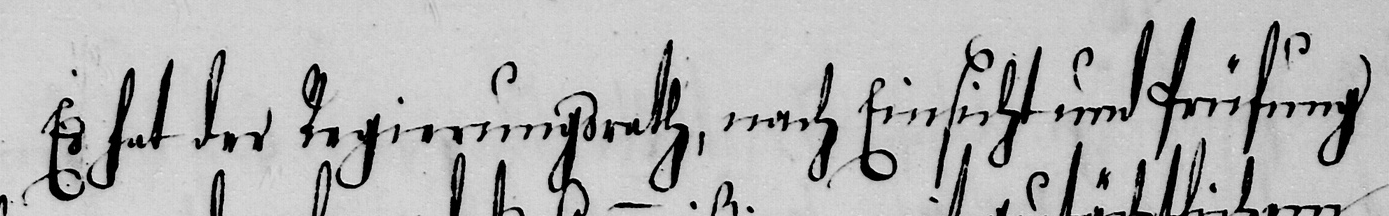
hat der Regierungsrath, nach Einsicht und Prüfung
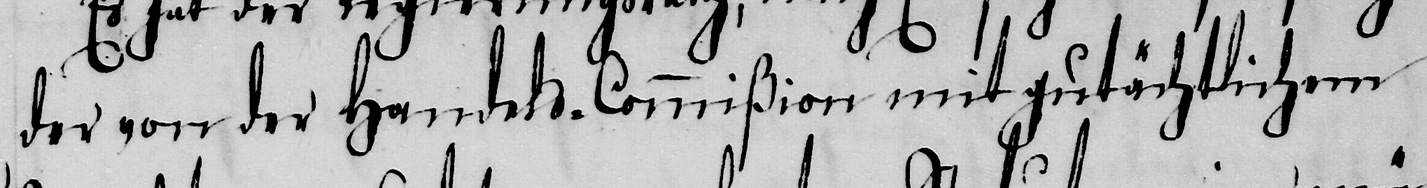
der von der Handels-Commißion mit gutächtlichem
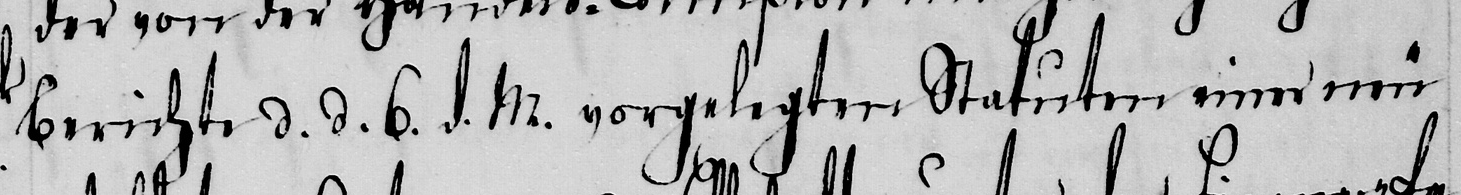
Berichte d. d. 6. d. M. vorgelegten Statuten einer neu
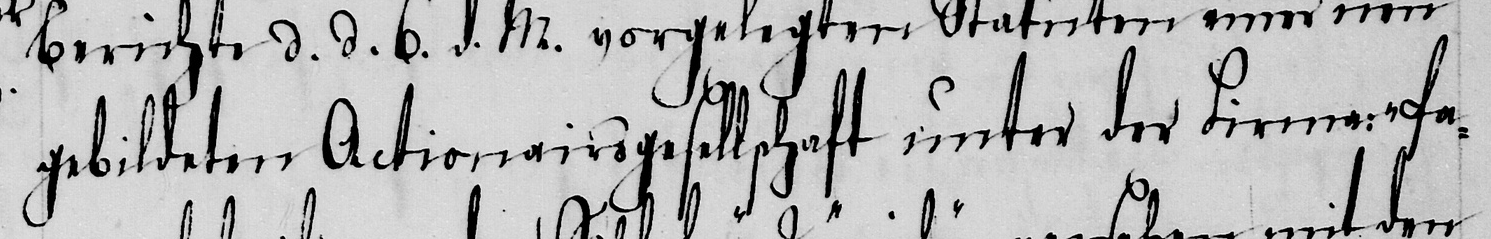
gebildeten Actionairsgesellschaft unter der Firma: „Pa¬
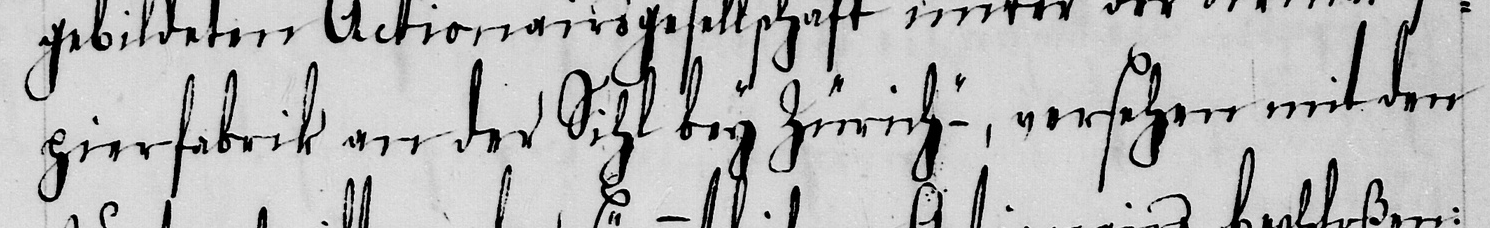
pierfabrik an der Sihl bey Zürich“ –, versehen mit den
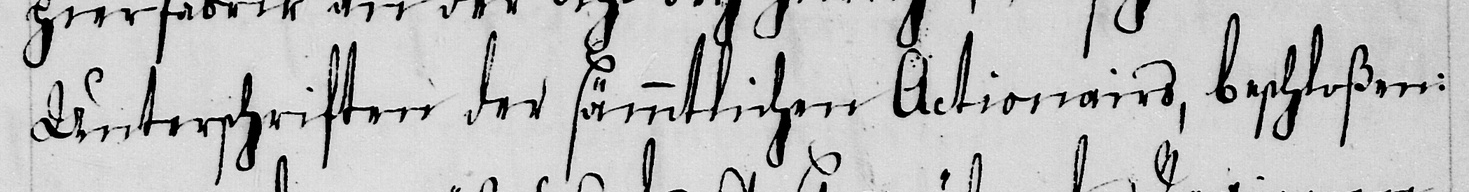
Unterschriften der sämmtlichen Actionairs, beschloßen:
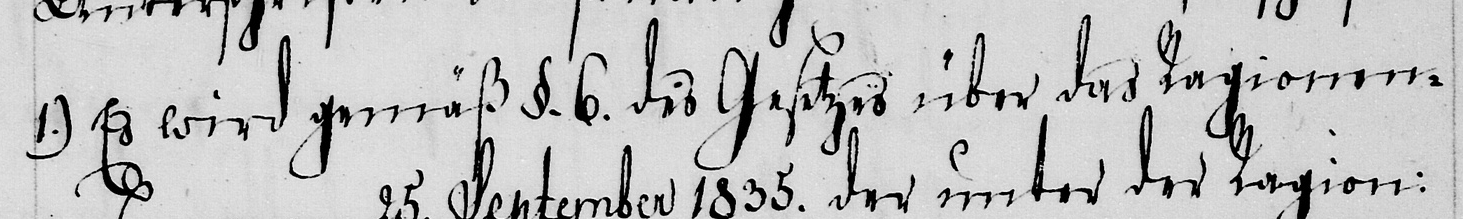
1.) Es wird gemäß §. 6. des Gesetzes über das Ragionen¬
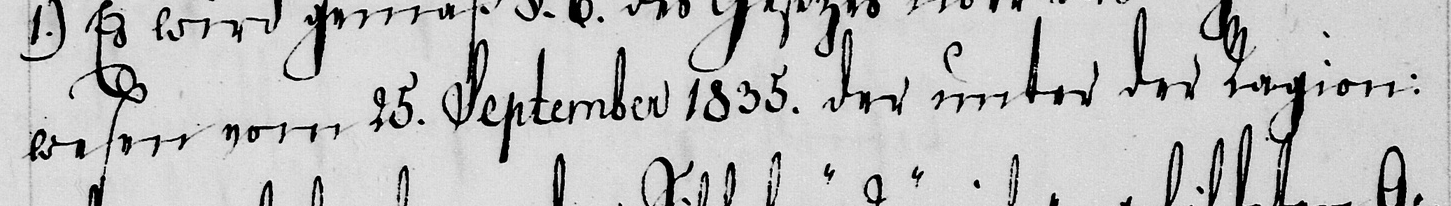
wesen vom 25. September 1835. der unter der Ragion:
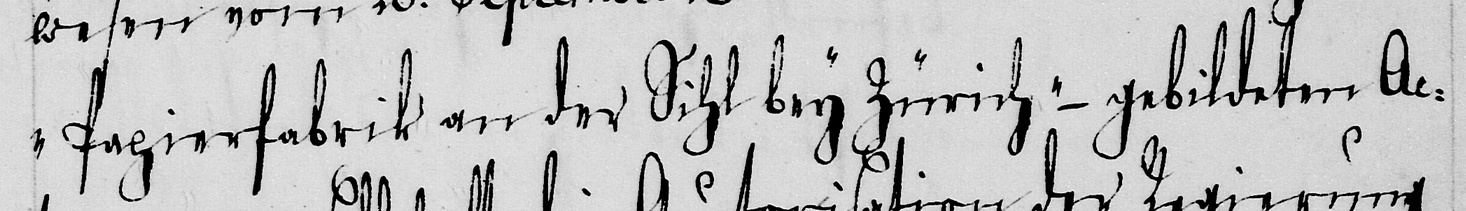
„Papierfabrik an der Sihl bey Zürich“ – gebildeten Ac¬
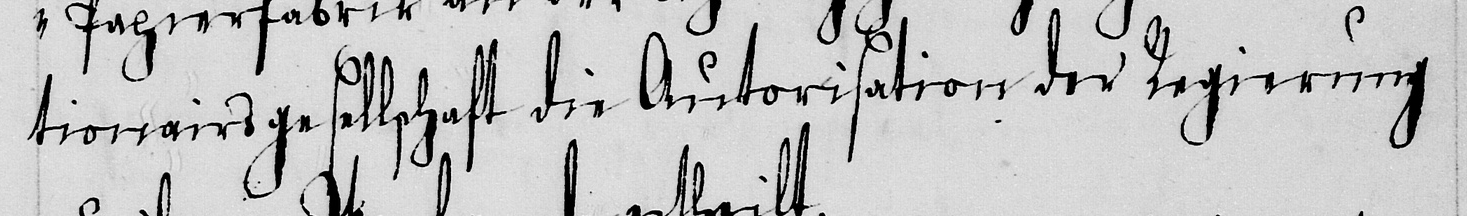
tionairsgesellschaft die Autorisation der Regierung
